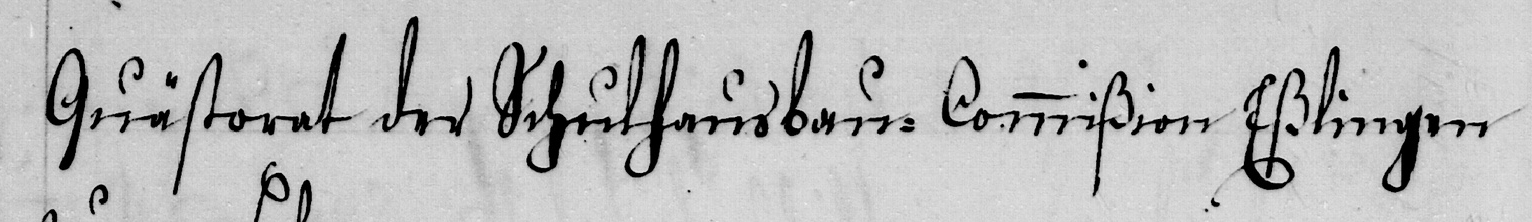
Quästorat der Schulhausbau-Commißion Eßlingen
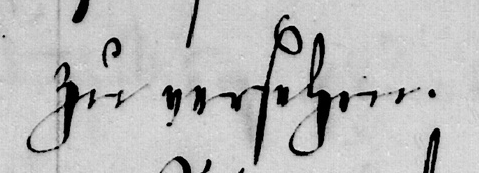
zu versehen.
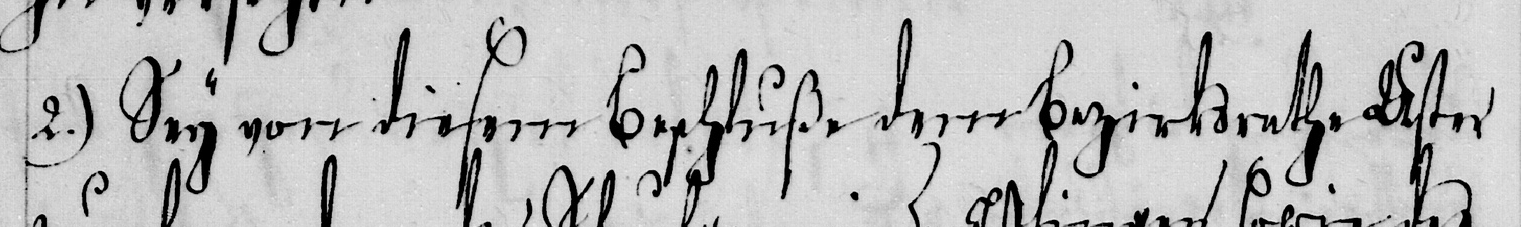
2.) Sey von diesem Beschluße dem Bezirksrathe Uster
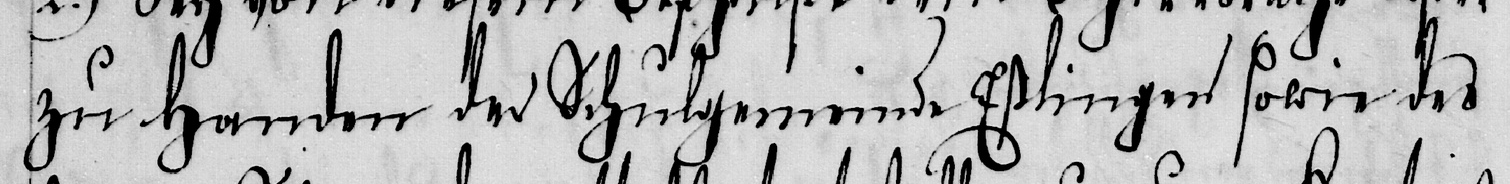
zu Handen der Schulgemeinde Eßlingen sowie des
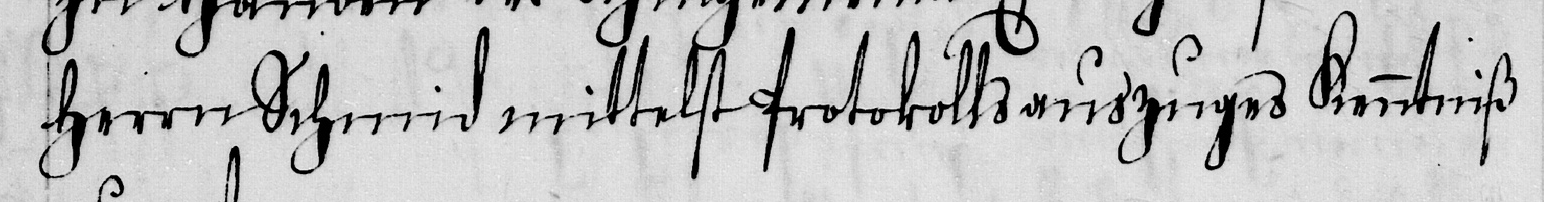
Herren Schmid mittelst Protokollsauszuges Kenntniß
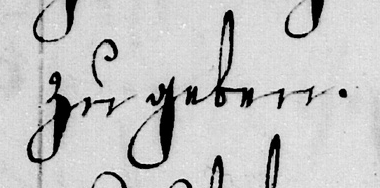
zu geben.
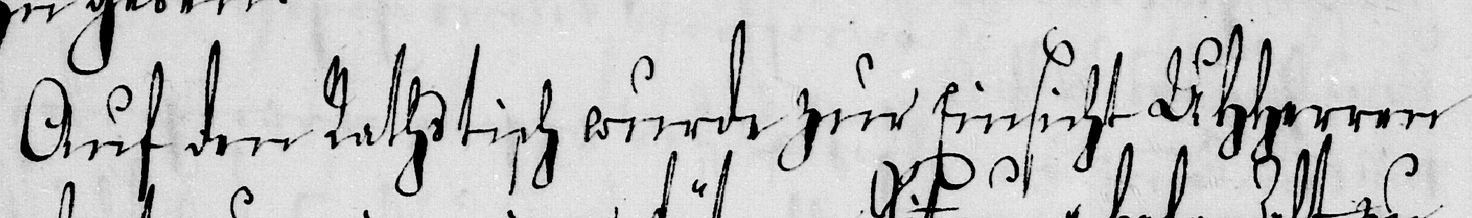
Auf den Rathstisch wurde zur Einsicht UHHerrn
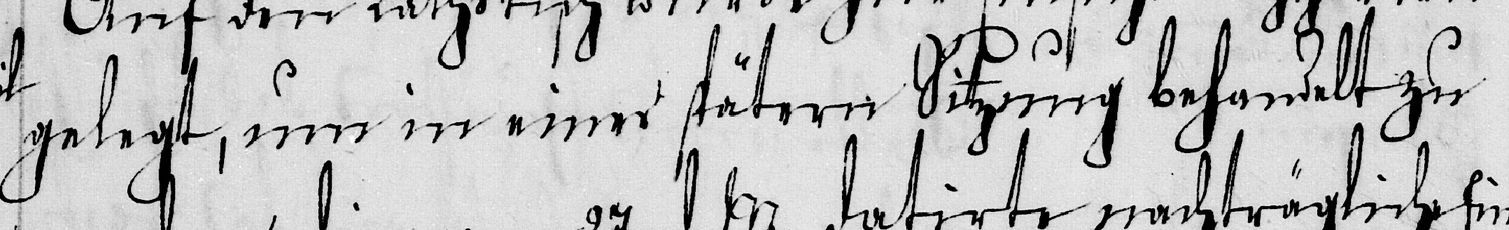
gelegt, um in einer spätern Sitzung behandelt zu
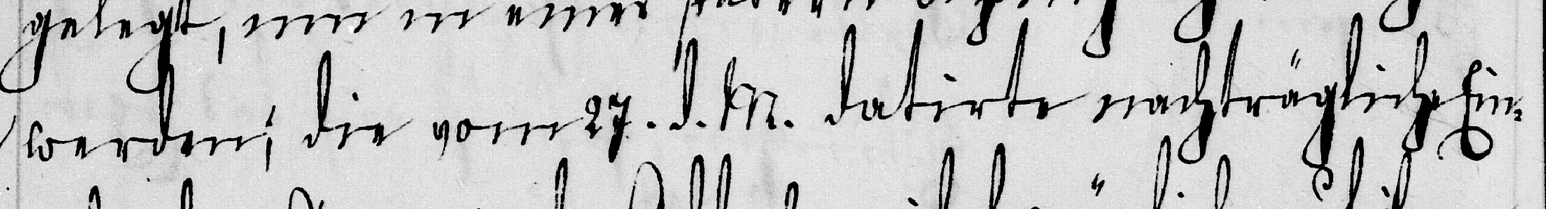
werden; die vom 27. d. M. datirte nachträgliche Ein¬
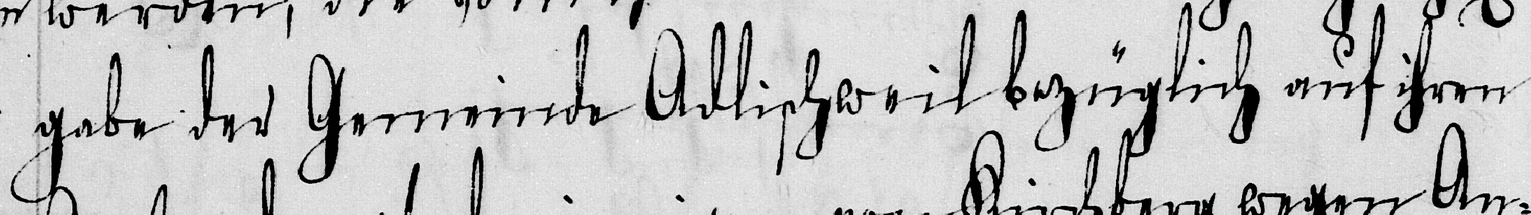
gabe der Gemeinde Adlischweil bezüglich auf ihren
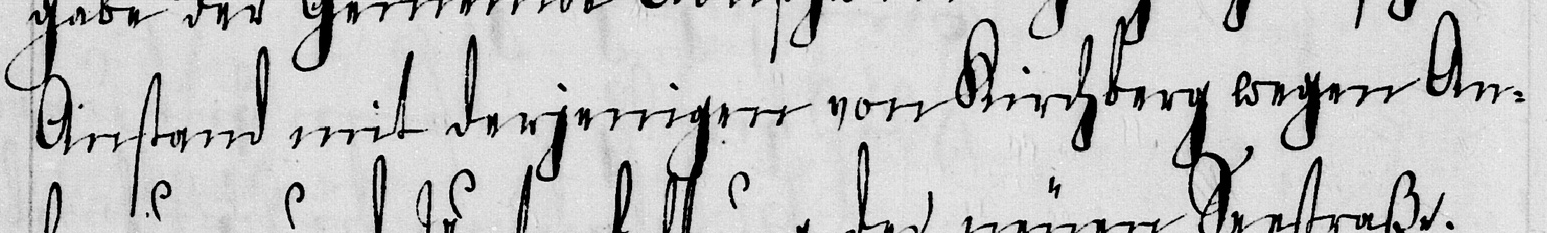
Anstand mit derjenigen von Kirchberg wegen An¬
